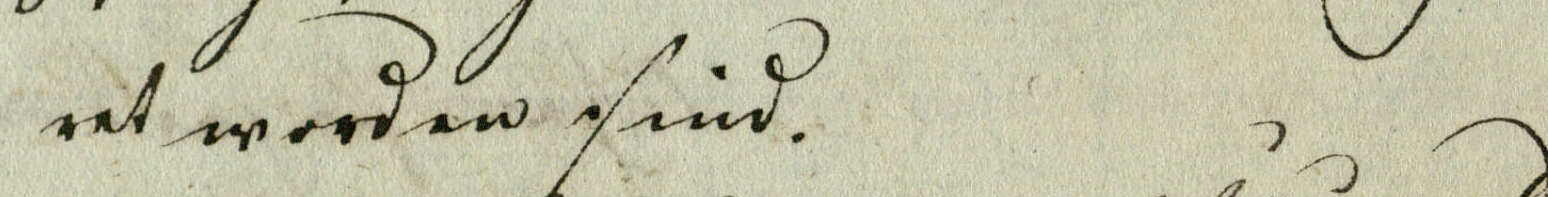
ret worden sind.
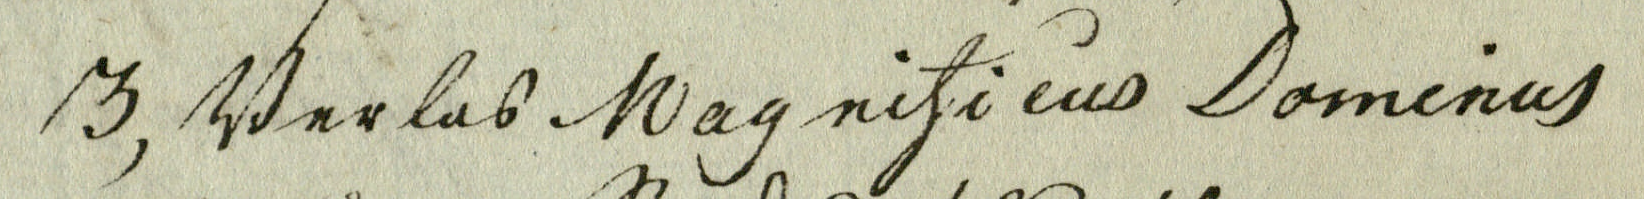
3, Verlas Magnificus Dominus
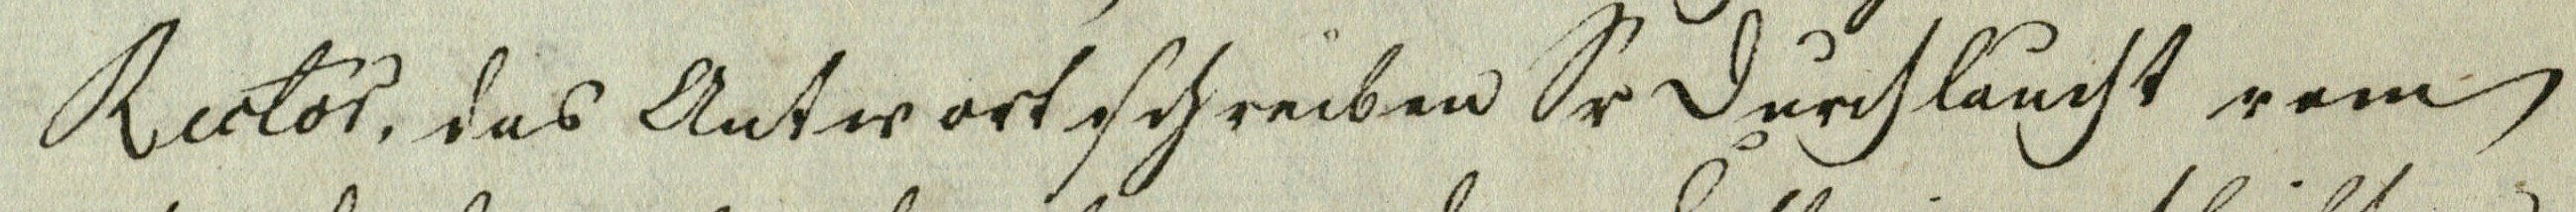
Rector, das Antwortschreiben Sr Durchlaucht vom
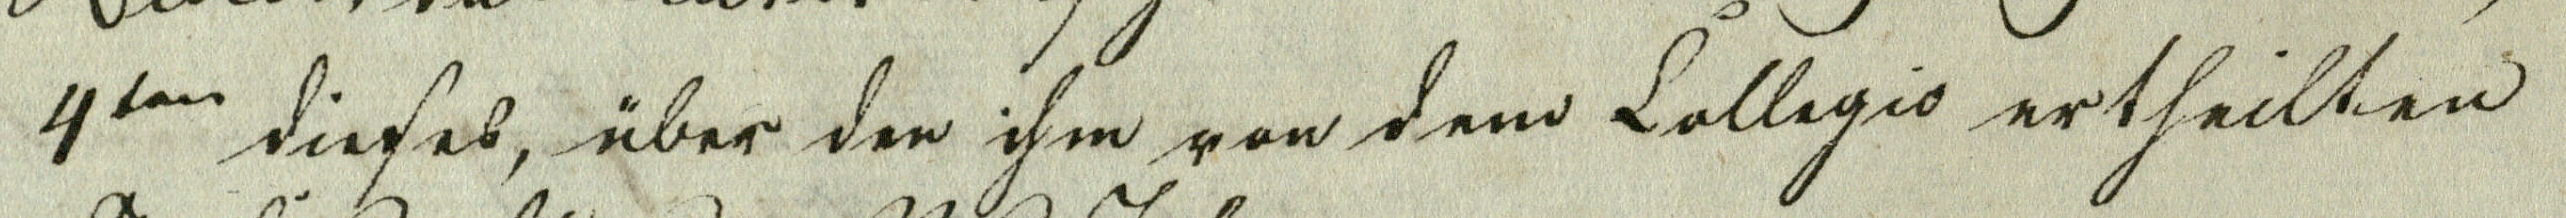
4ten dieses, über den ihm von dem Collegio ertheilten
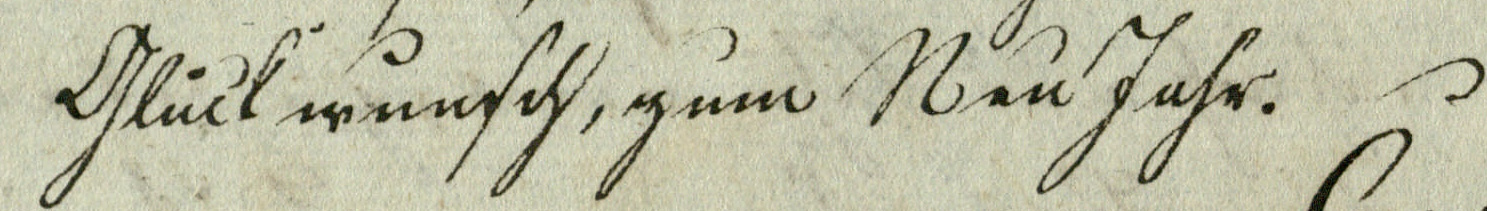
Glückwunsch, zum Neu Jahr.
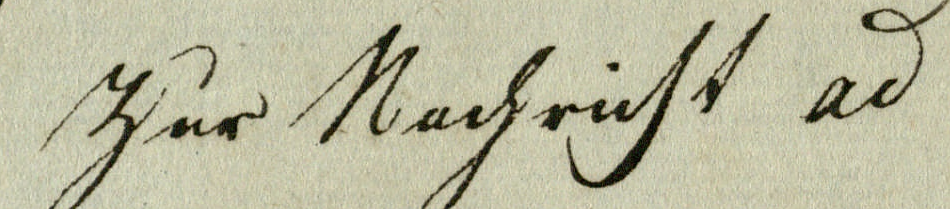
Zur Nachricht ad
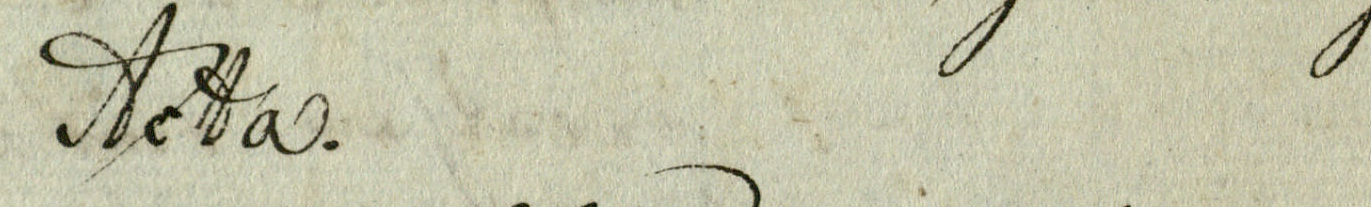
Acta.
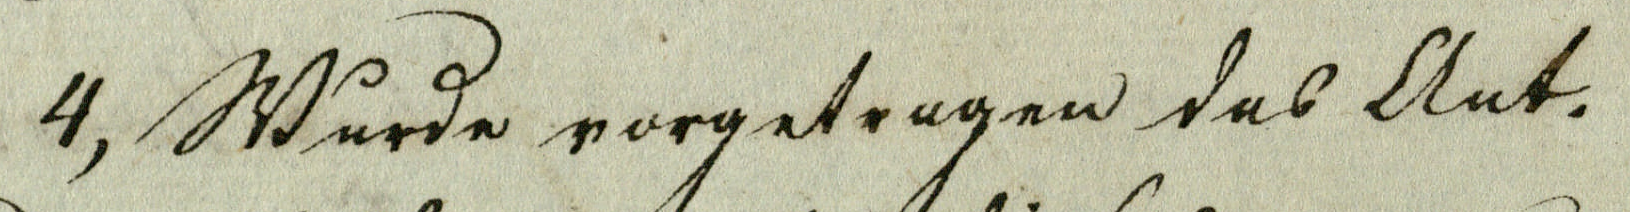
4, Wurde vorgetragen das Ant¬
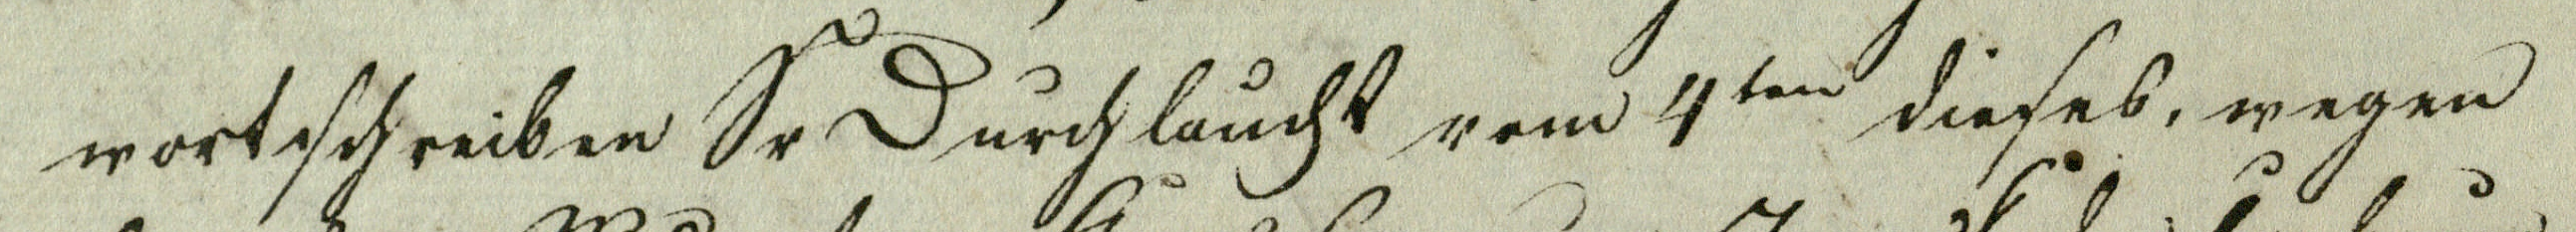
wortschreiben Sr Durchlaucht vom 4ten dieses, wegen
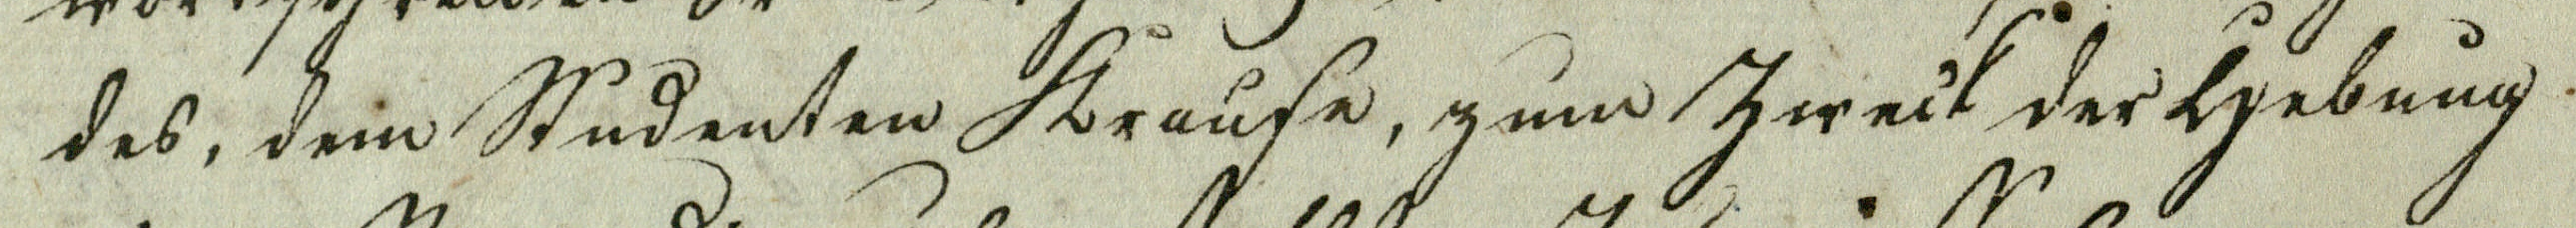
des, dem Studenten Krause, zum Zweck der Hebung
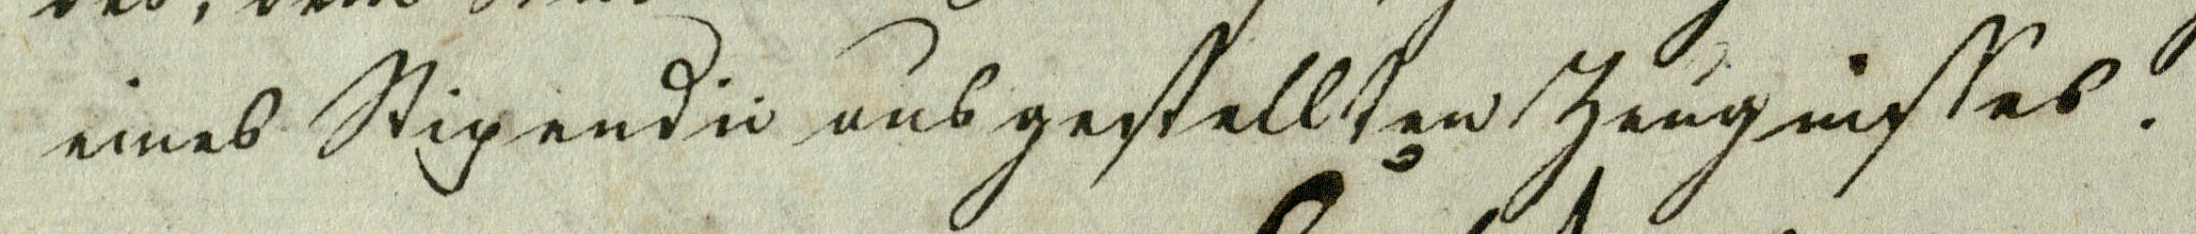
eines Stipendii ausgestellten Zeugnisses.
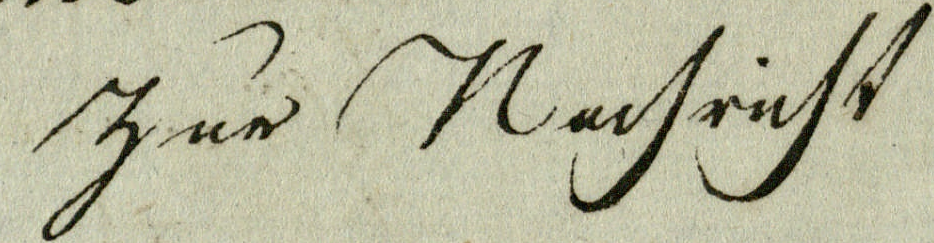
Zur nachricht
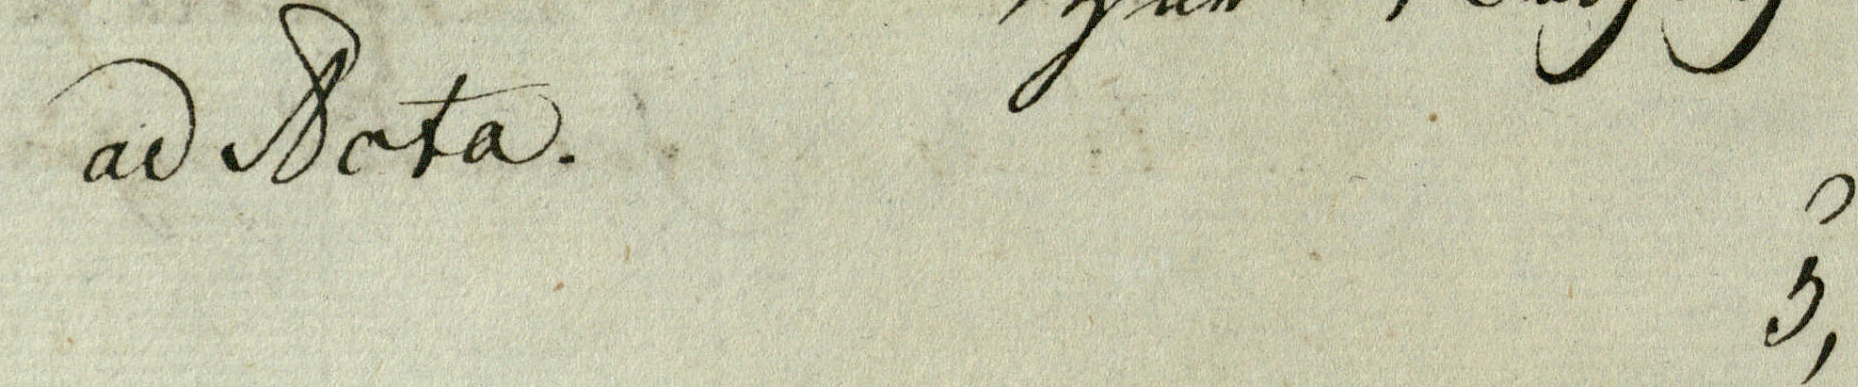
ad Acta. 5,
